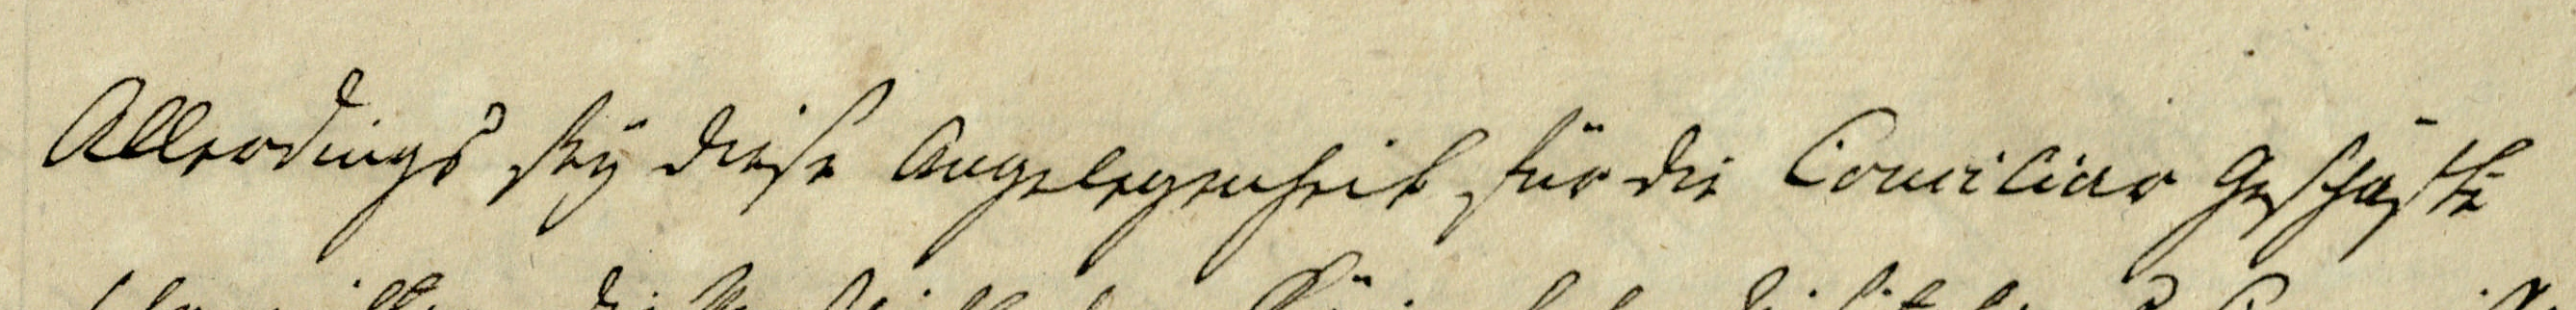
Allerdings seÿ diese Angelegenheit für die Conciliar Geschäfte
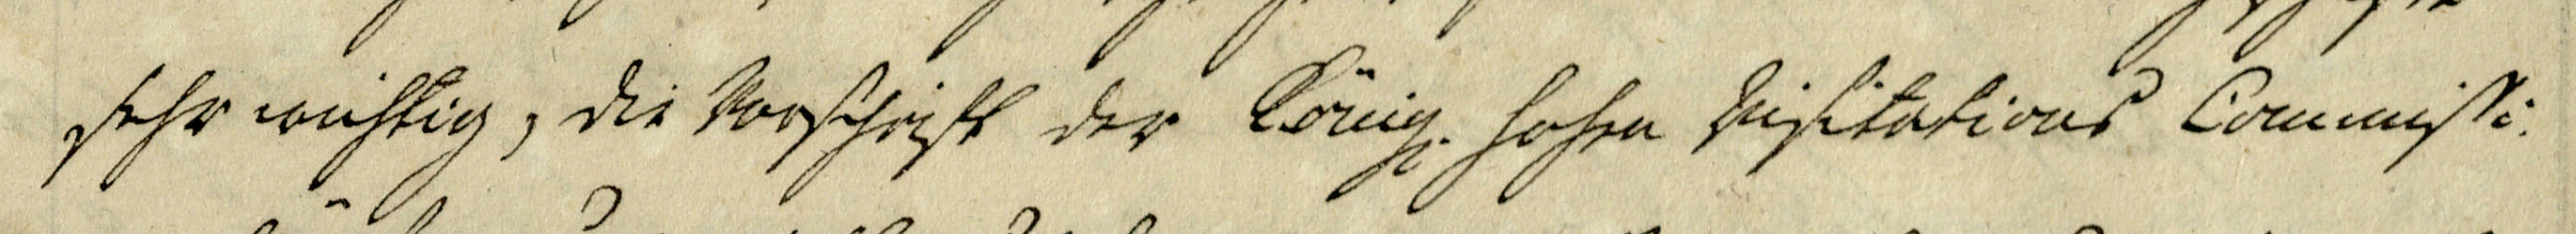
sehr wichtig, die Vorschrift der Königl. hohen Visitations Commissi¬
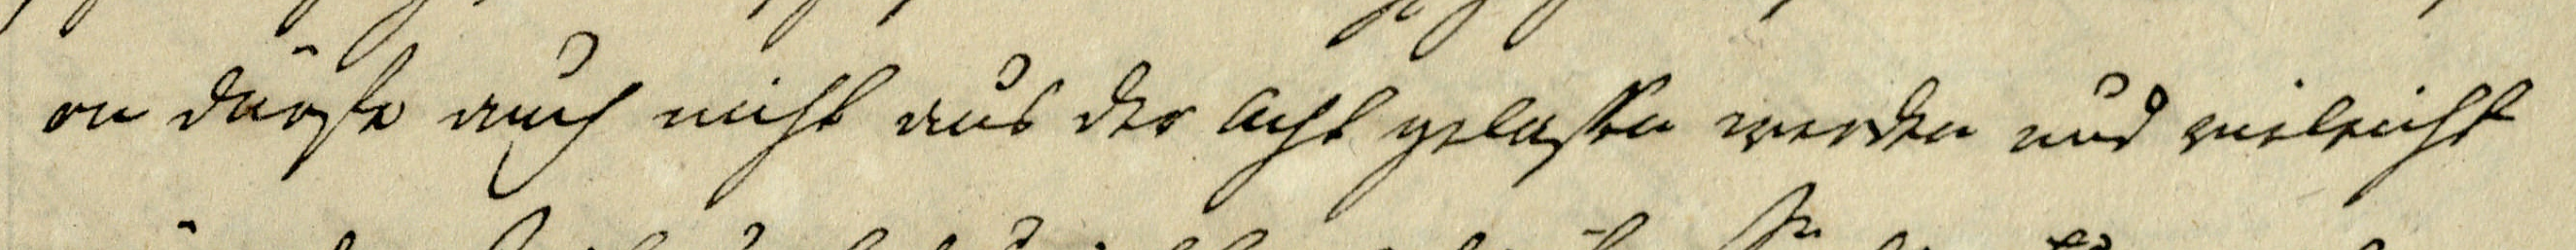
on dürfe auch nicht aus der Acht gelassen werden und vieleicht
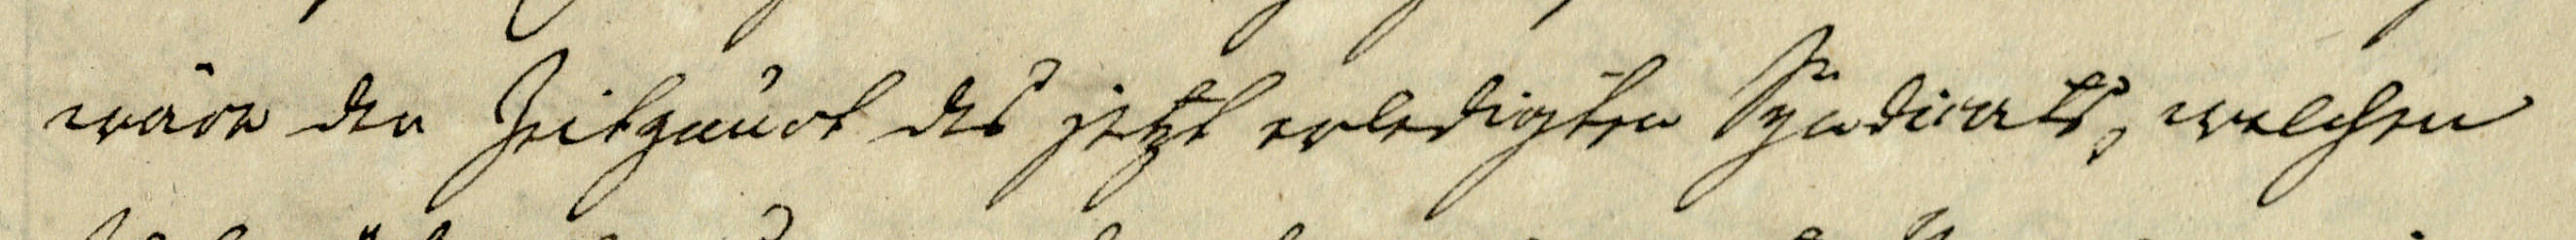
wäre der Zeitpunct des jetzt erledigten Sÿndicats, welchen
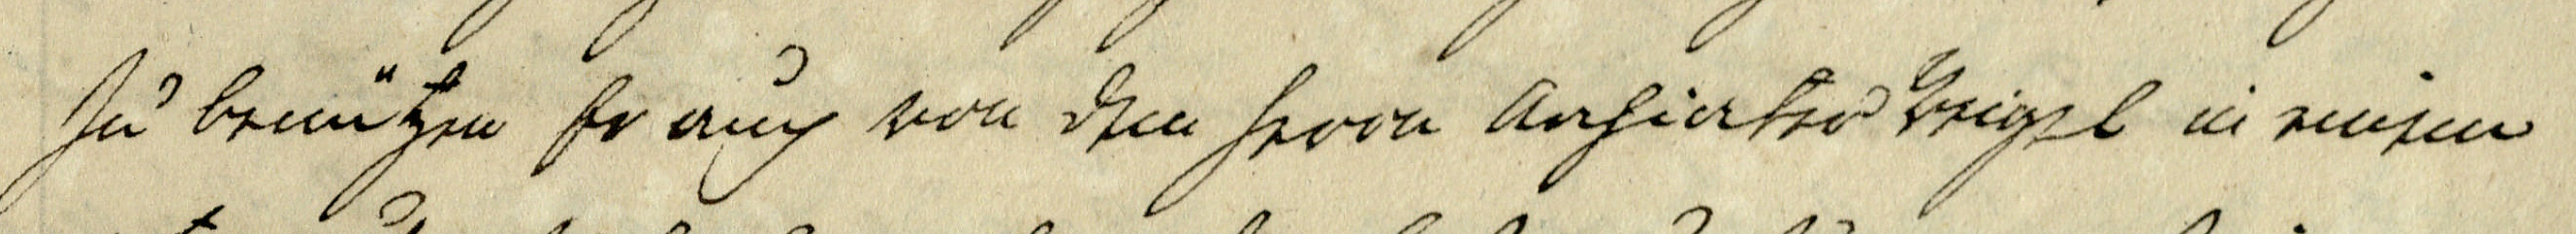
zu benützen Er auch von dem Herrn Archiater Weigel in einem
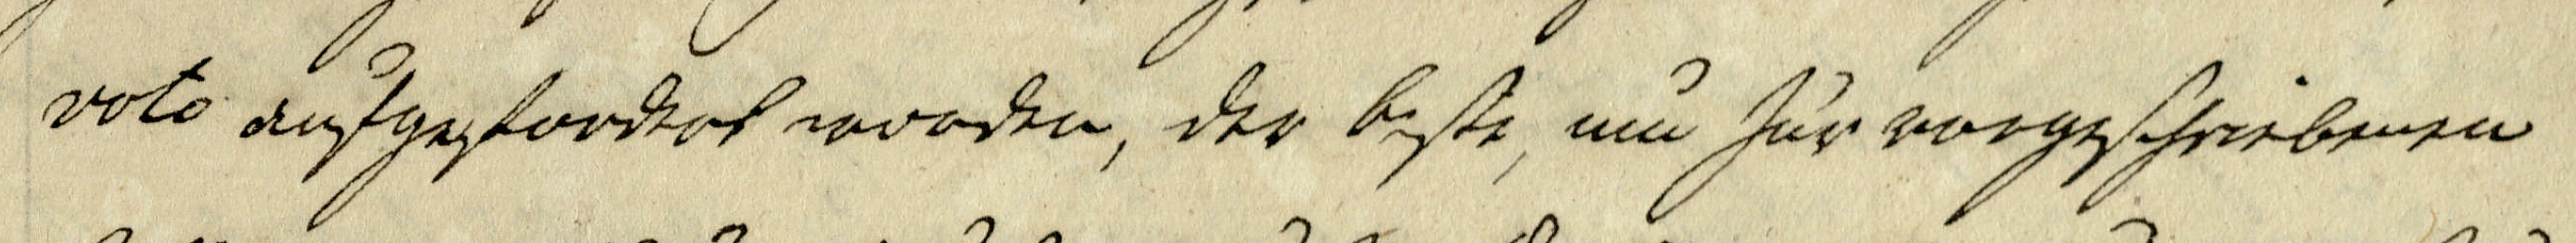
voto aufgefordert worden, der beste, um zur vorgeschriebenen
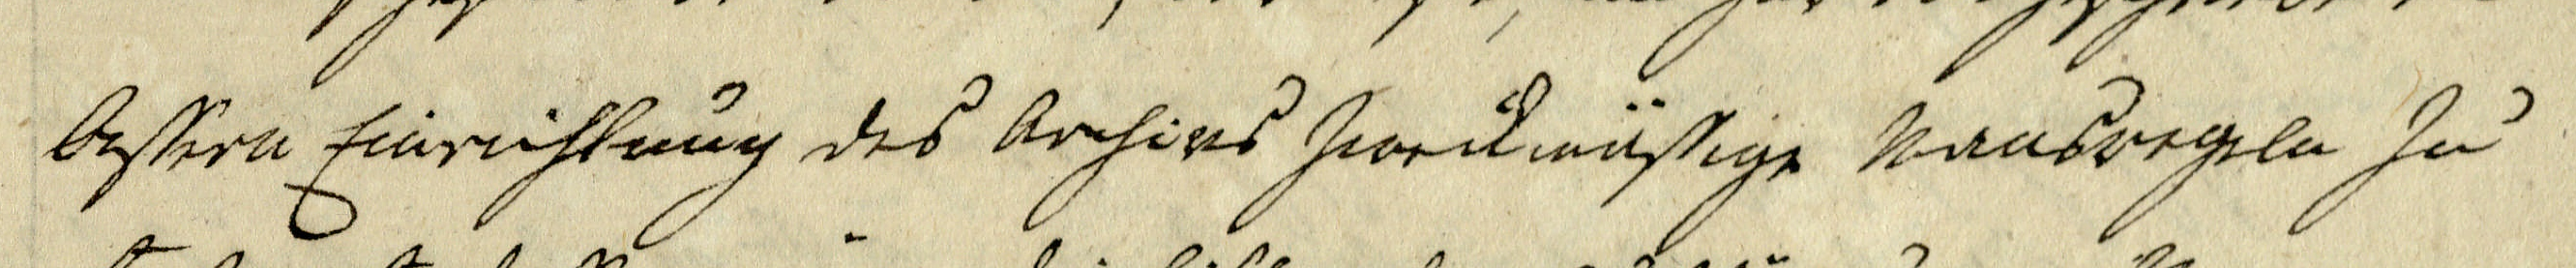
bessern Einrichtung des Archivs zweckmässige Maasregeln zu
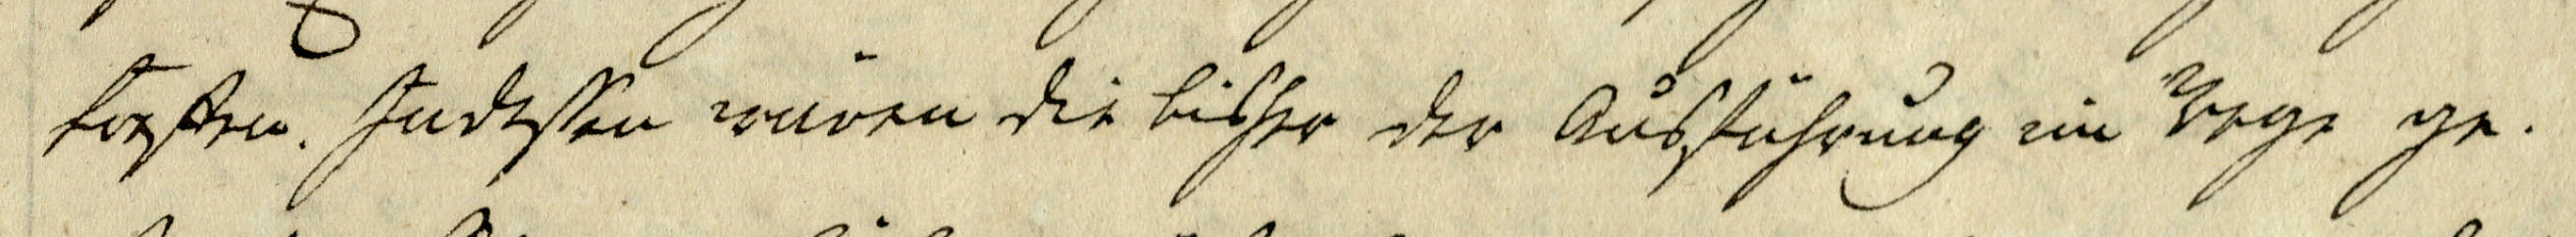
treffen. Indessen wären die bisher der Ausführung im Wege ge¬
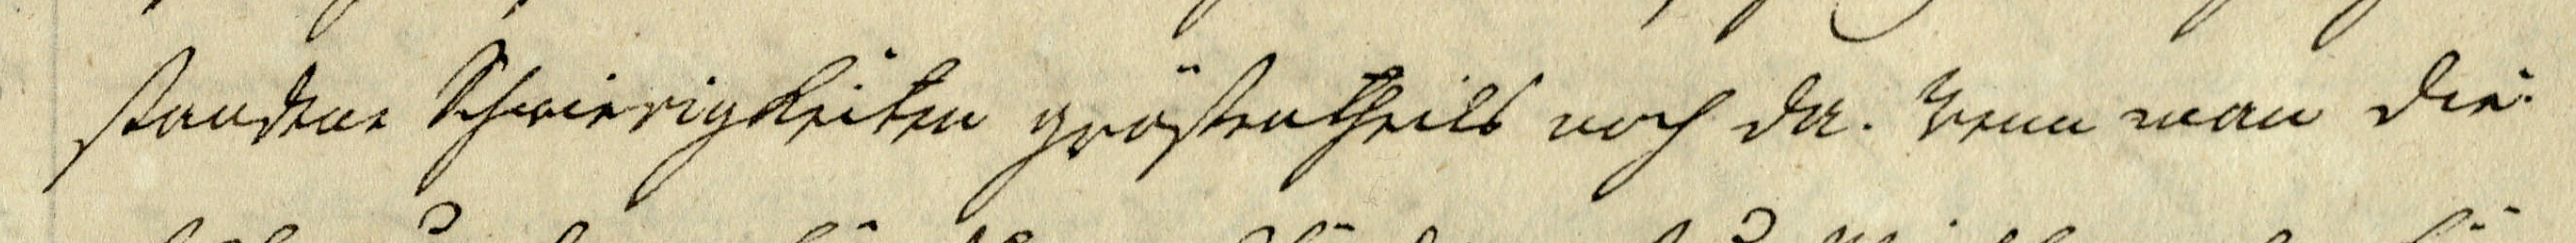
standene Schwierigkeiten gröstentheils noch da. Wenn man die¬
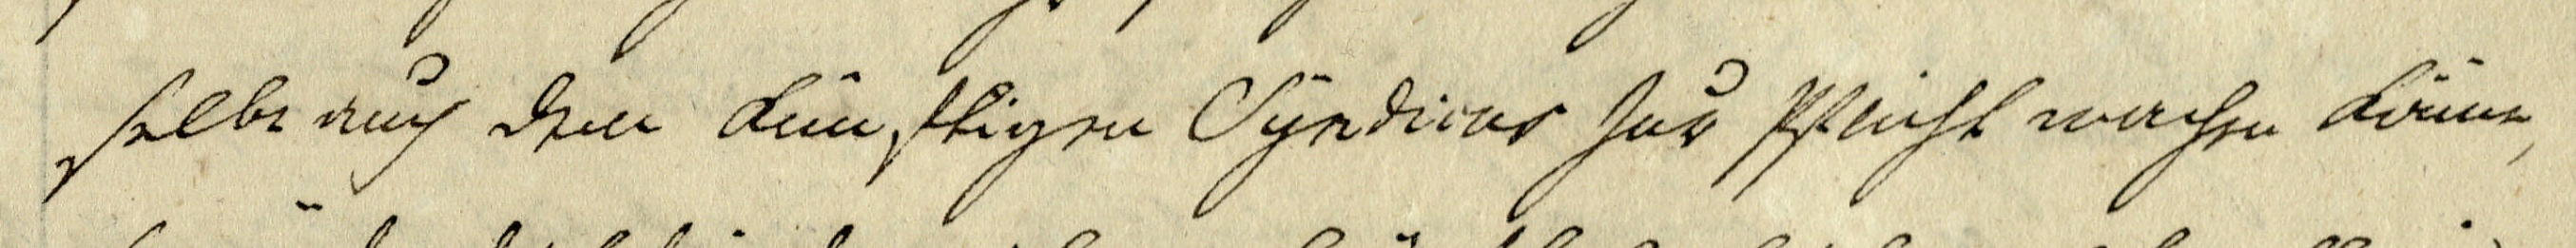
selbe auch dem künftigen Sÿndicus zur Pflicht machen könne,
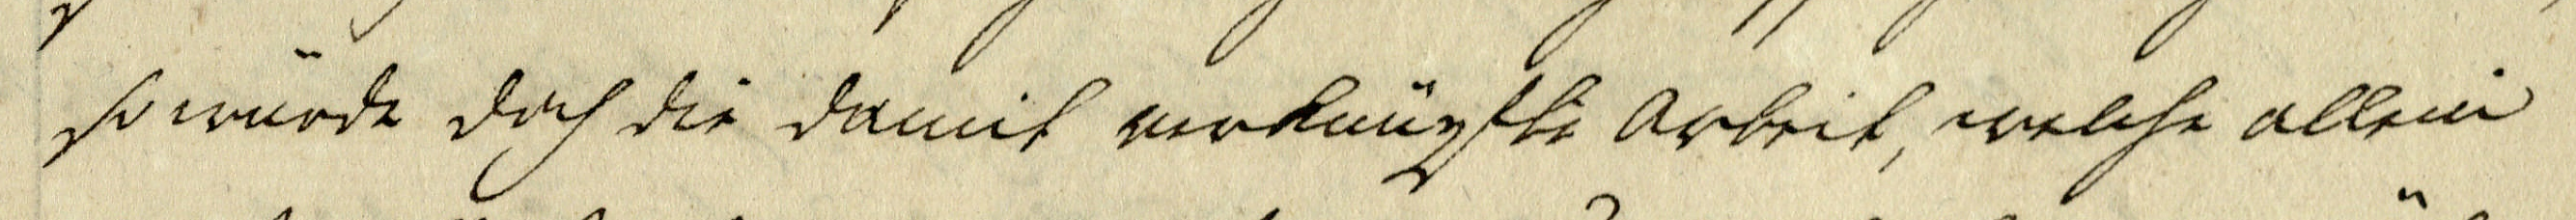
so würde doch die damit verknüpfte Arbeit, welche allein
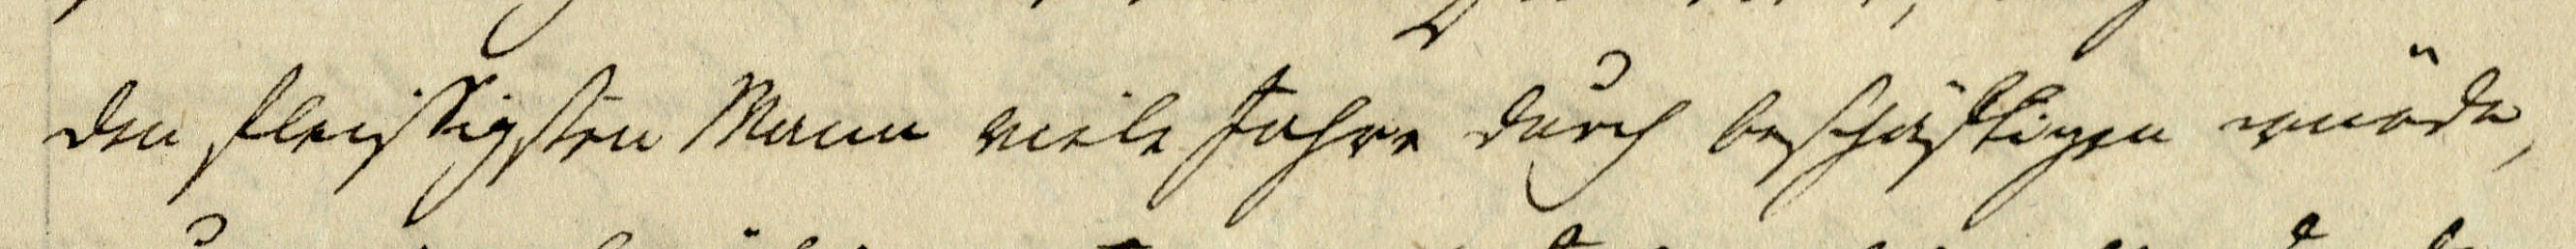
den fleissigsten Mann viele Jahre durch beschäftigen würde,
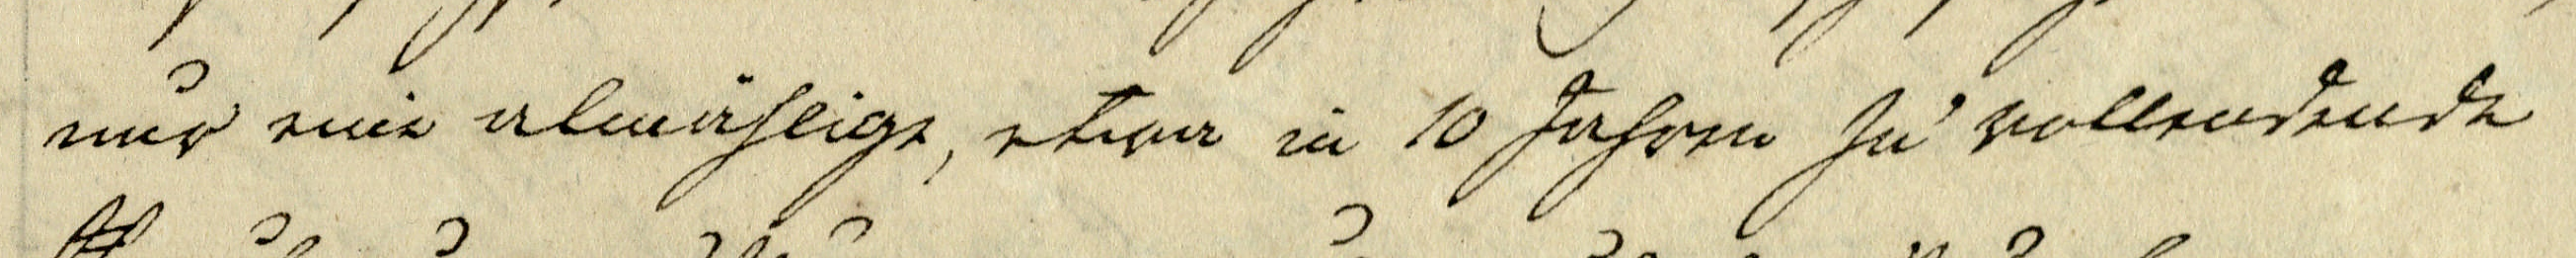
nur eine almählige, etwa in 10 Jahren zu vollendende
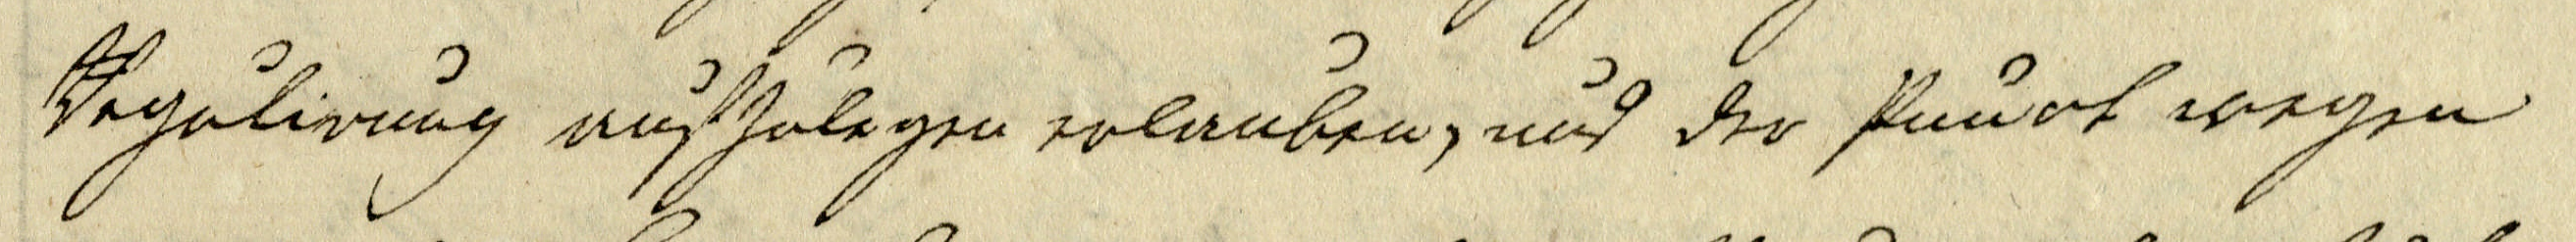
Regulirung aufzulegen erlauben, und der Punct wegen
